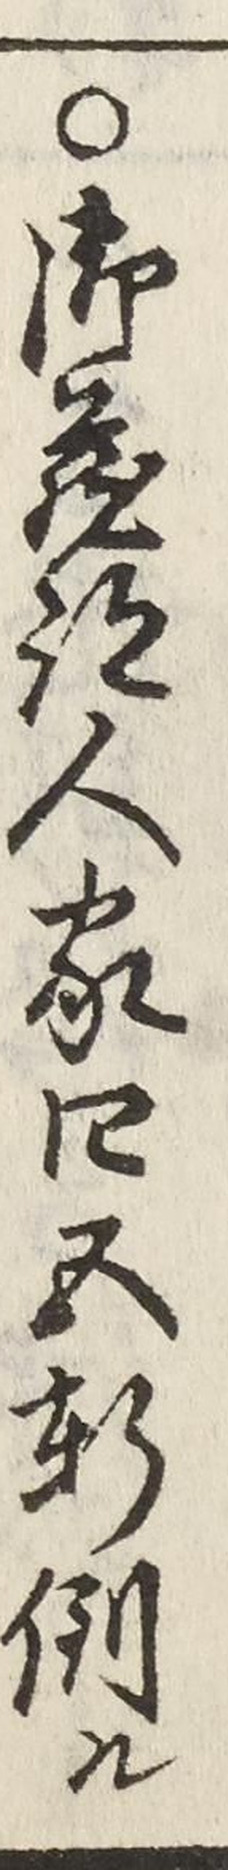○御蔵跡人家四五軒倒ル
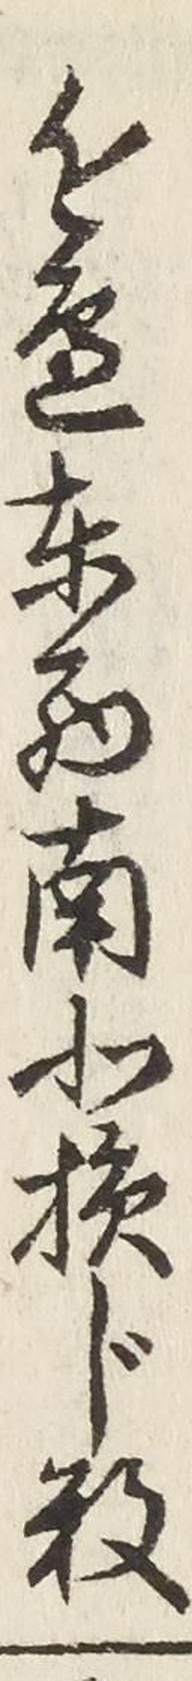近辺東西南北損じ数
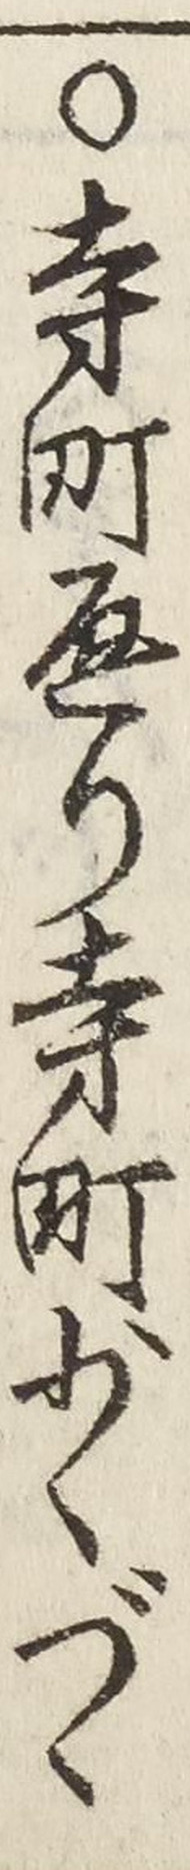○寺町通り寺町少々づゝ
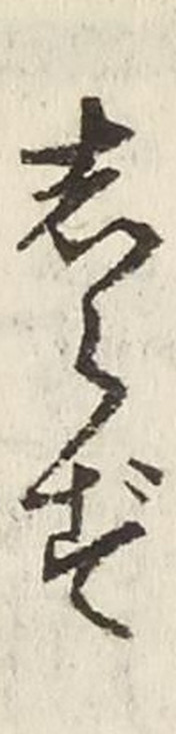しらず
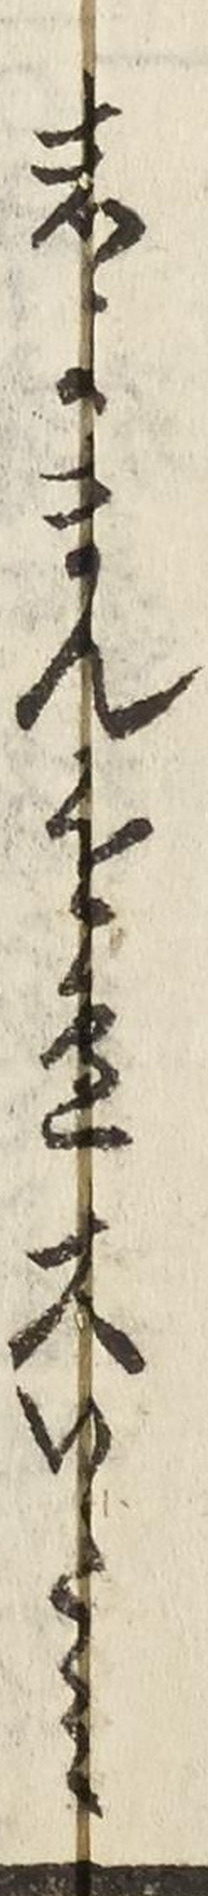末にまん近辺大いたみ
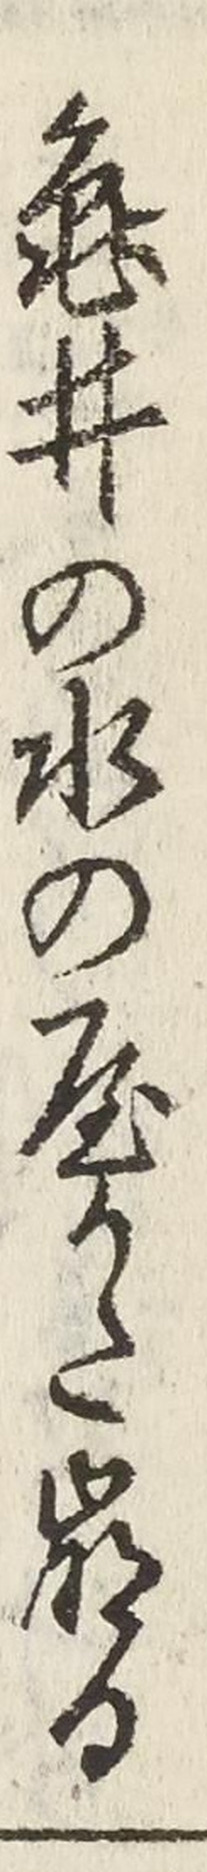亀井の水の屋かた崩る
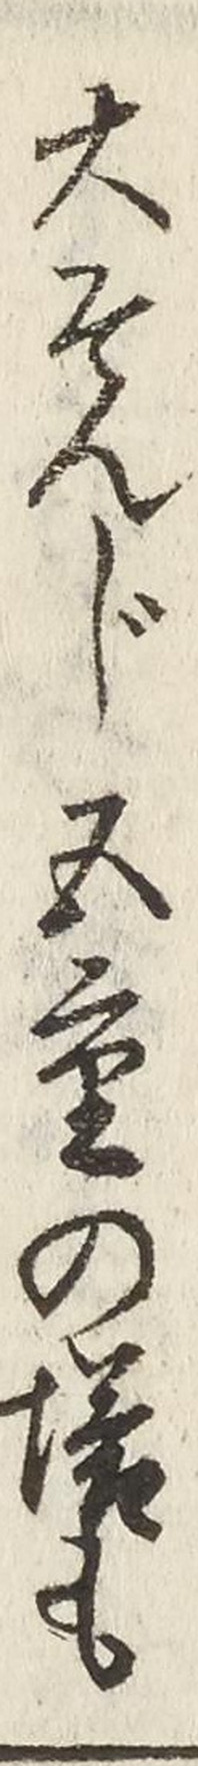大そんじ五重の塔も
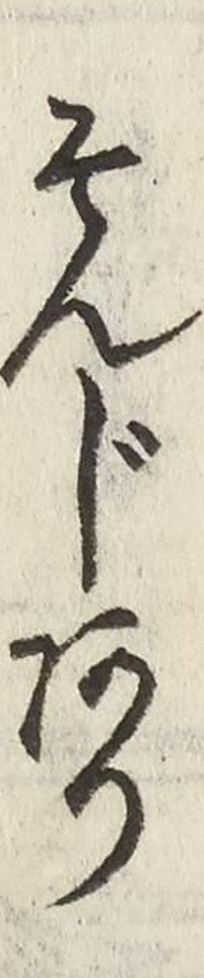そんじあり
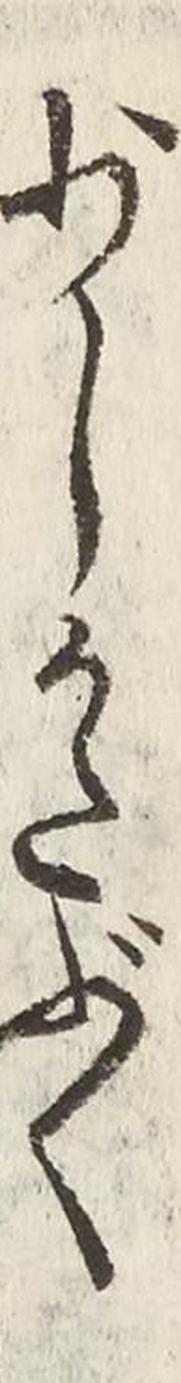少しかたぶく
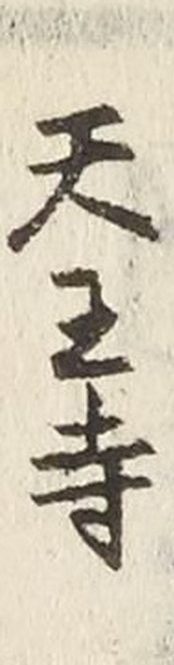天王寺
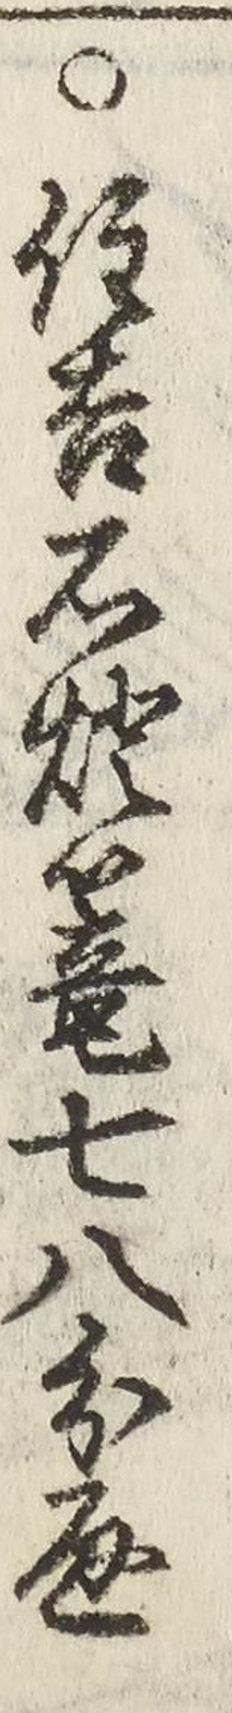○住𠮷石燈篭七八分通

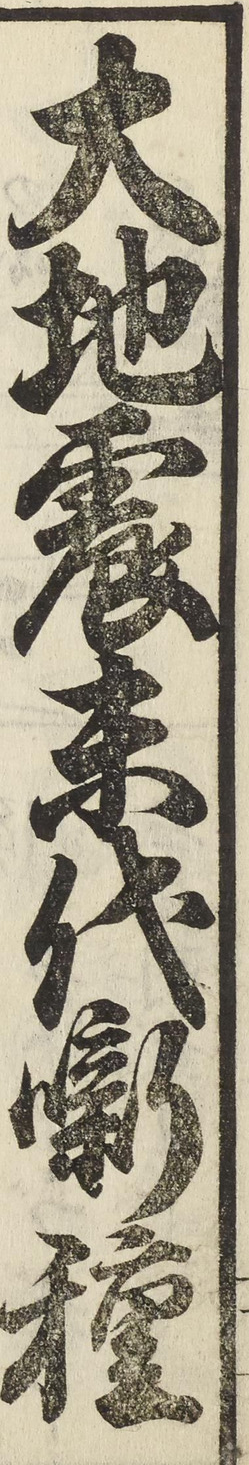大地震末代噺種
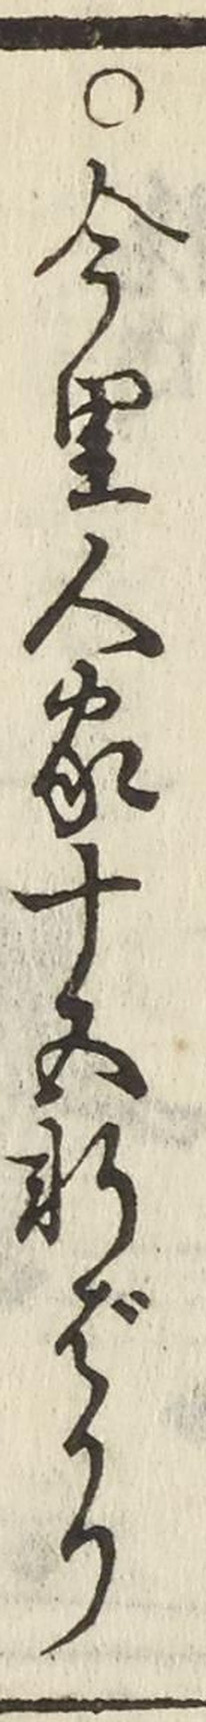○今里人家十五軒ばかり
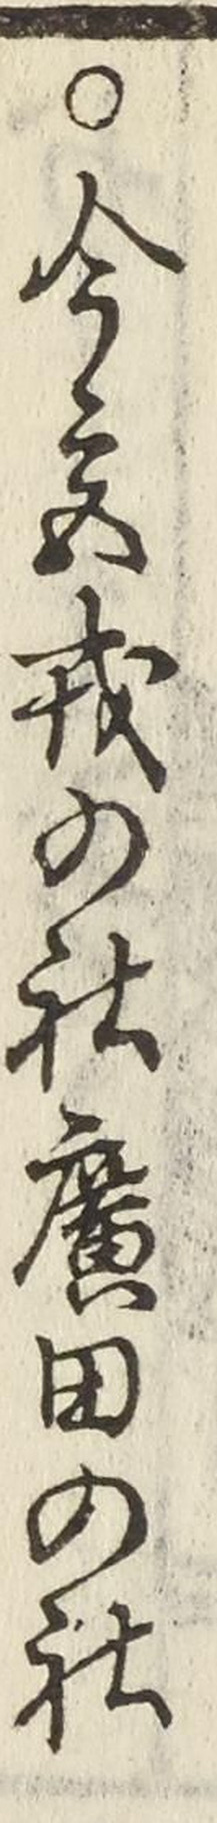○今宮戎の社広田の社
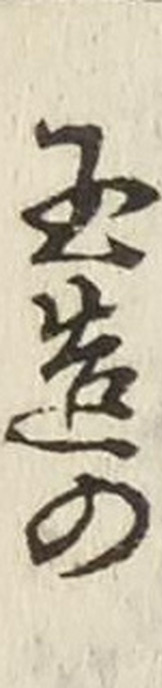玉造の
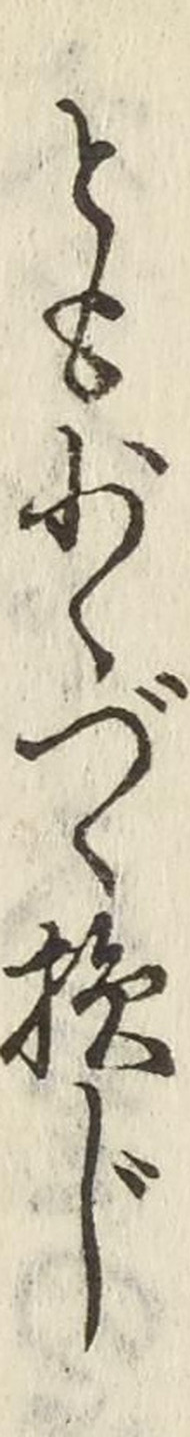とも少々づゝ損じ
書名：大地震大津浪末代噺種　（二編　全）
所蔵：東京大学地震研究所図書室 Earthquake Research Institute Library, The University of Tokyo, JAPAN
